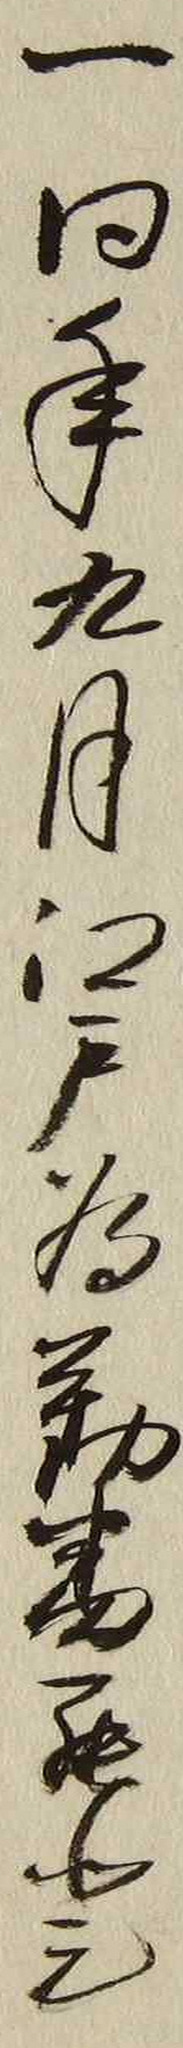一同年九月江戸為筋番番罷登
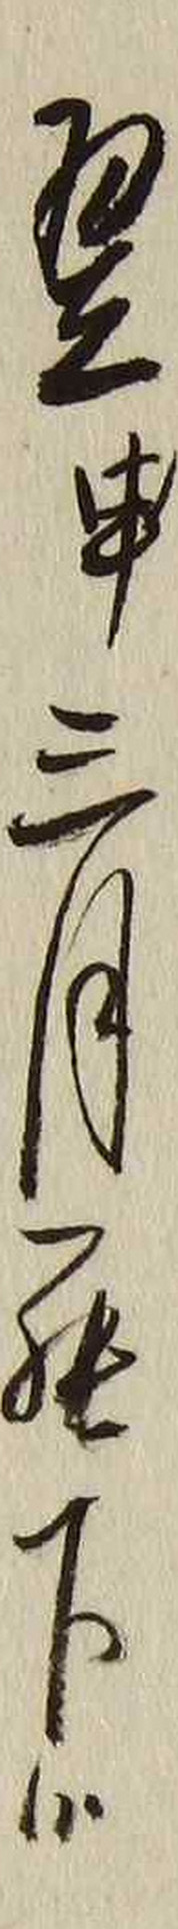翌申三月罷下候
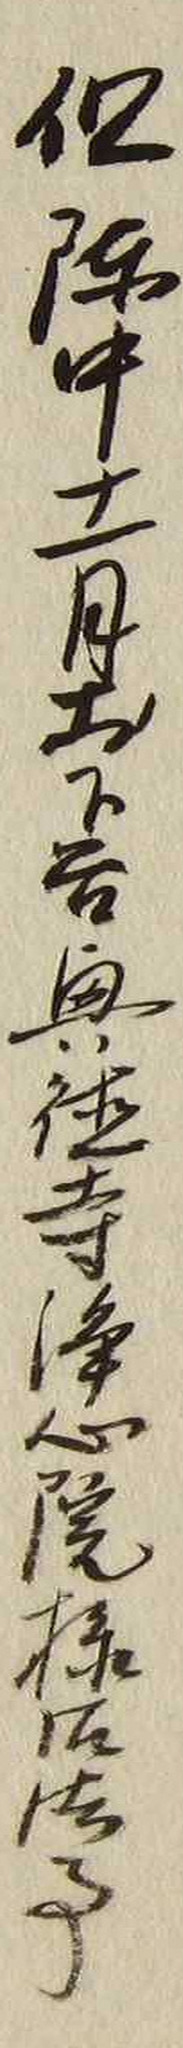但陳中十一月於下谷興徳寺浄心院様御法事
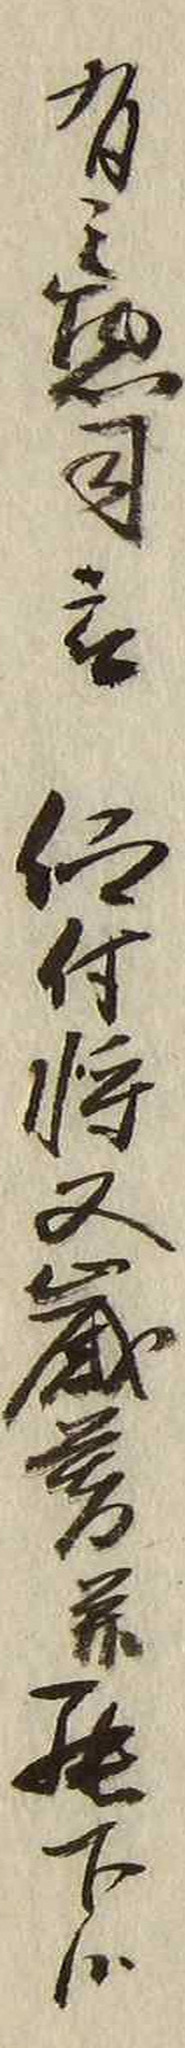有之惣司被仰付将又歳暮并罷下候

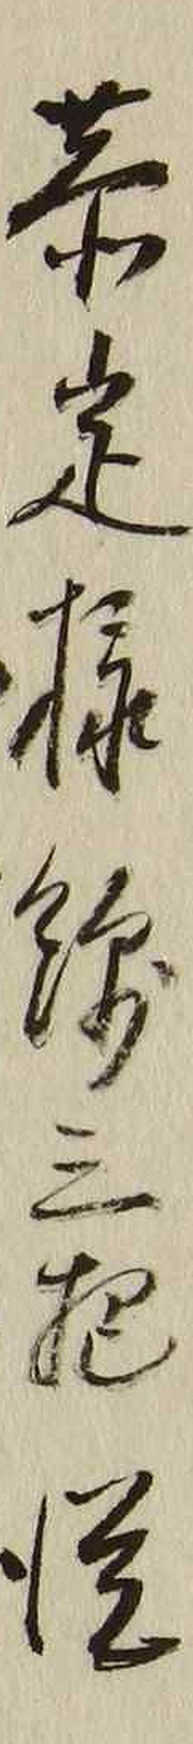恭定様綿三把従
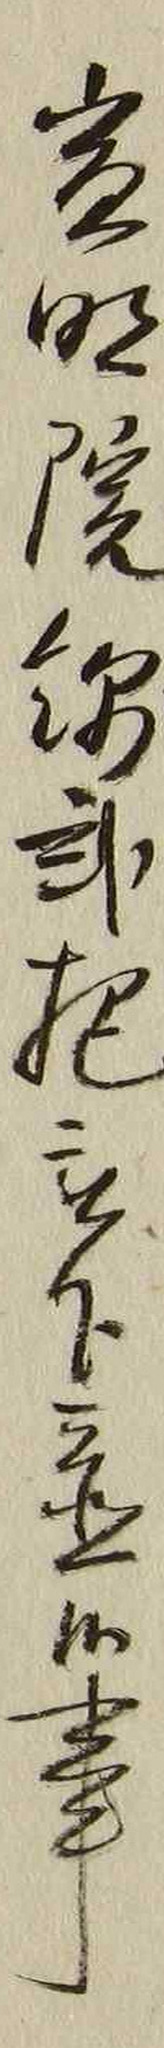宣明院綿弐把被下置候事
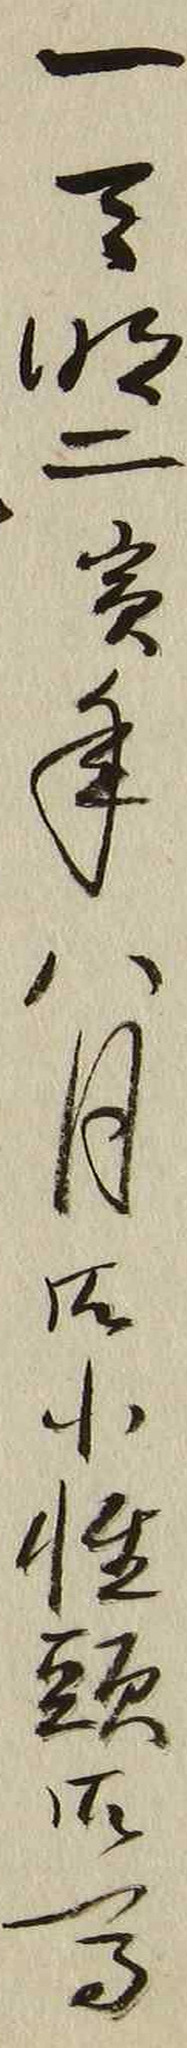一天明二寅年八月御小性頭御馬
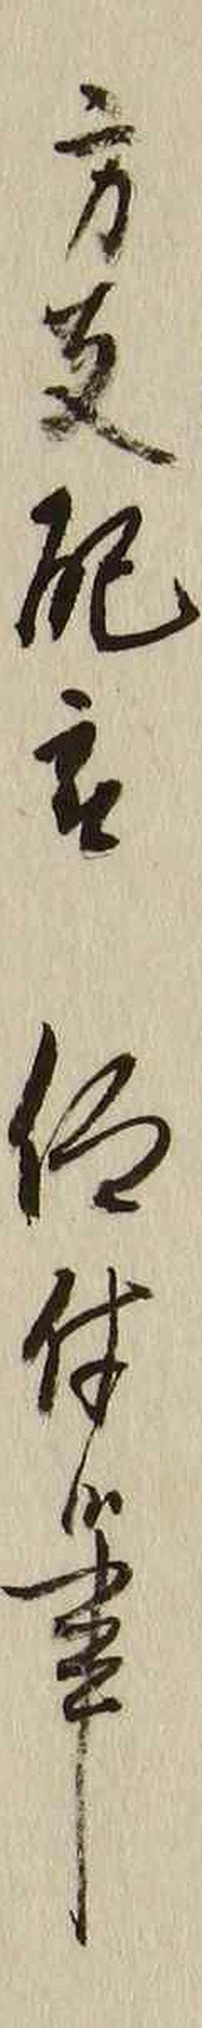方支配被仰付候事
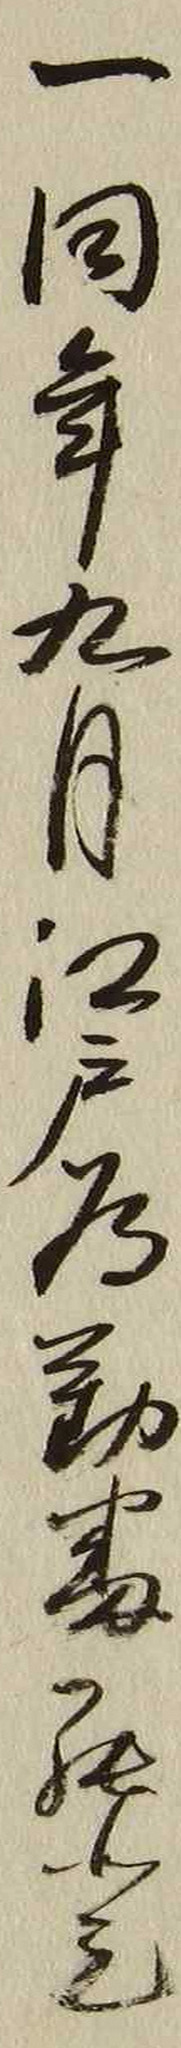一同年九月江戸為勤番罷登
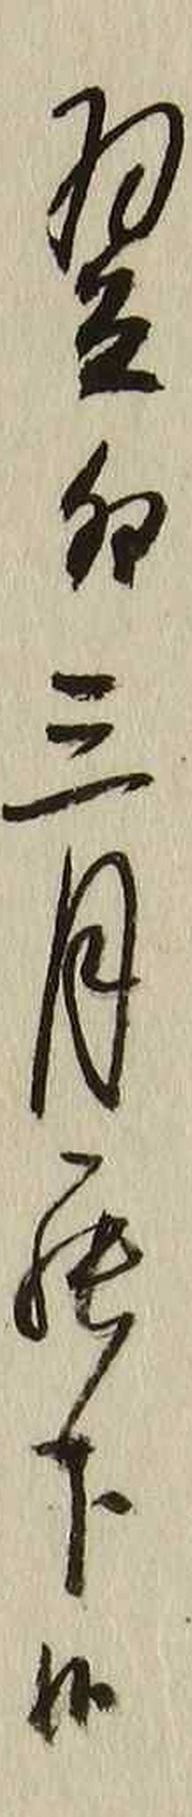翌卯三月罷下候
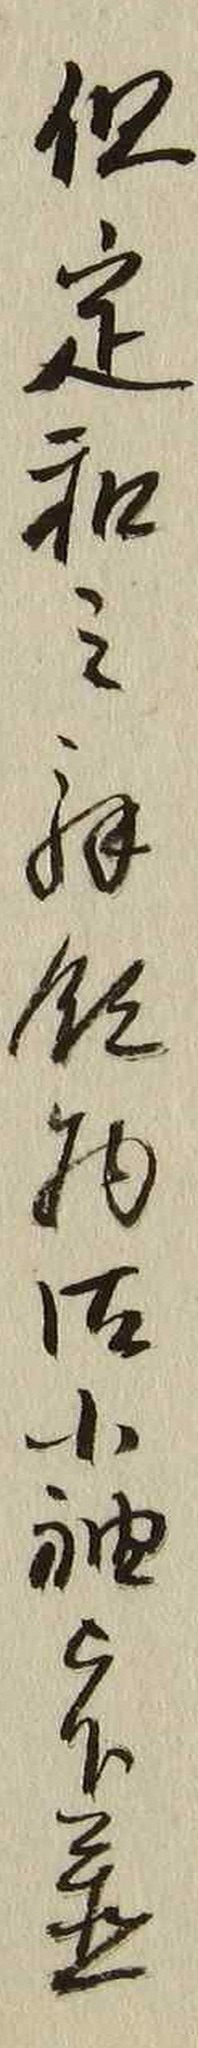但定和之拝領物御小袖被下置
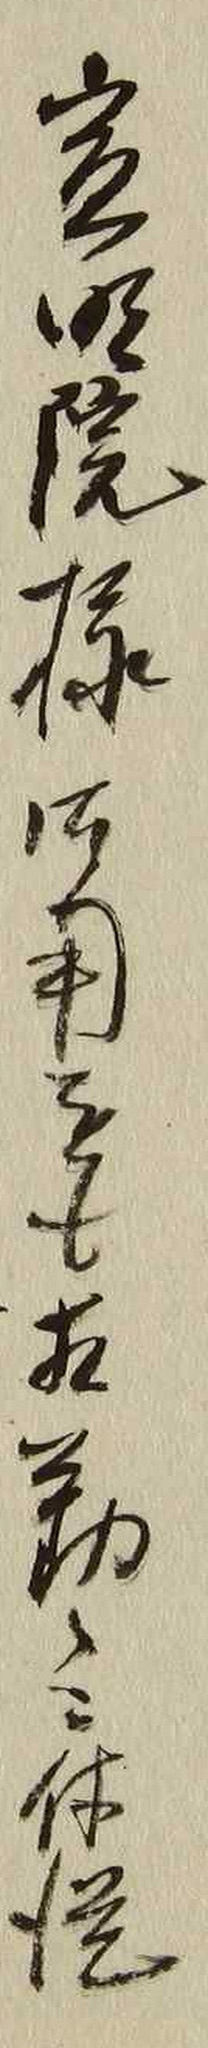宣明院様御用をも相勤候ニ付従
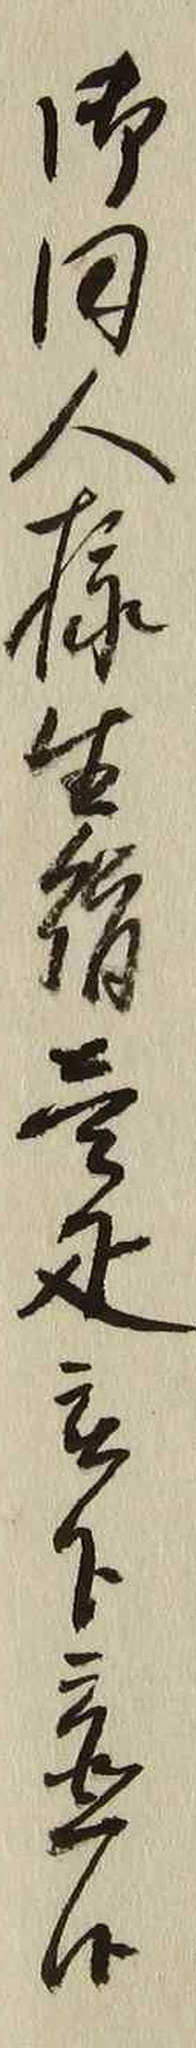御同人様生絹壱疋被下置候
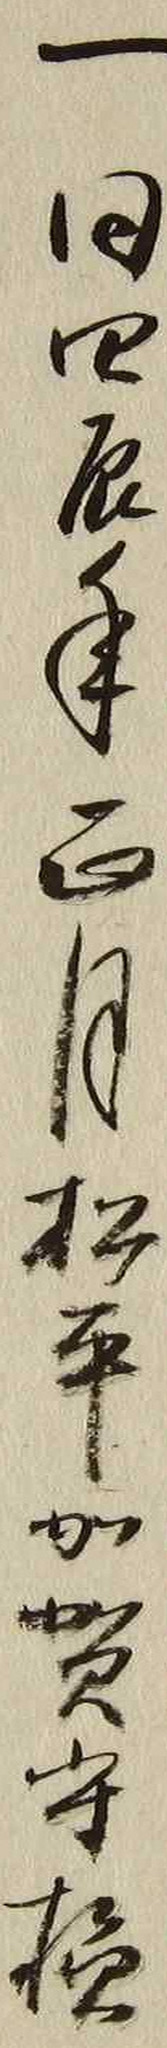一同四辰年正月松平加賀守様
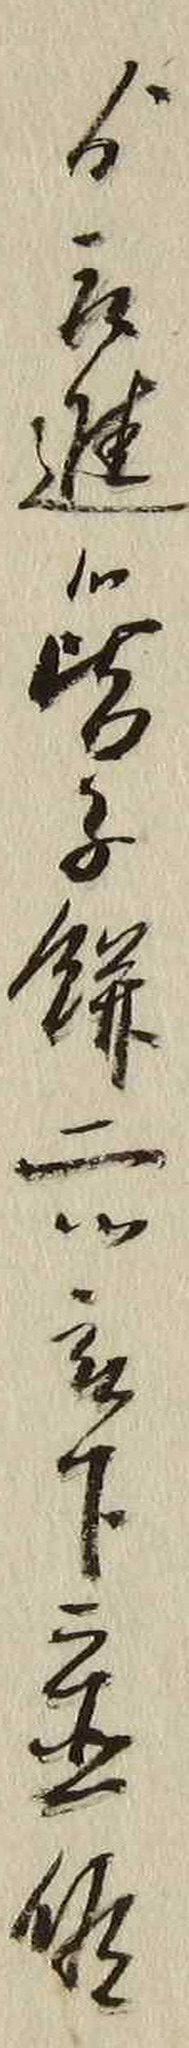ゟ被進候皆子餅二ツ被下置候
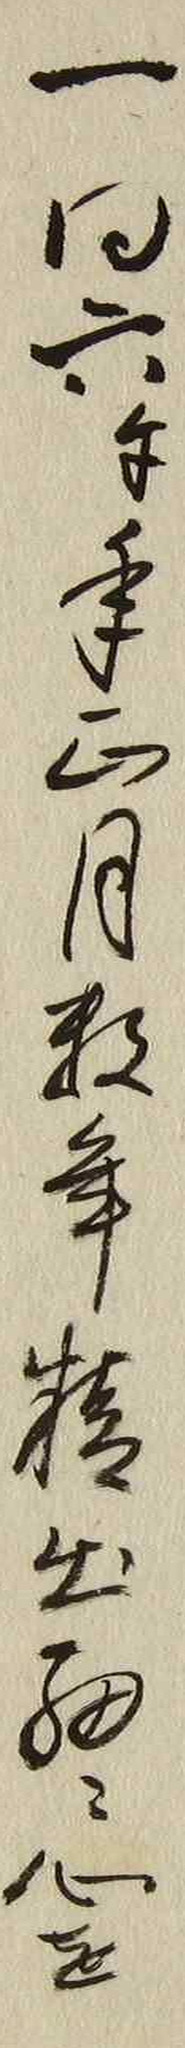一同六午年正月数年精出細々心を
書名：諸士系譜　巻之356　す之部6
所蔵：会津若松市立会津図書館
